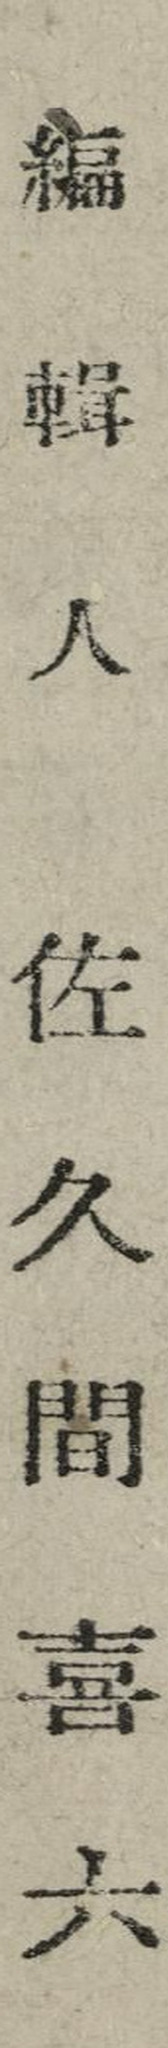編輯人佐久間喜六
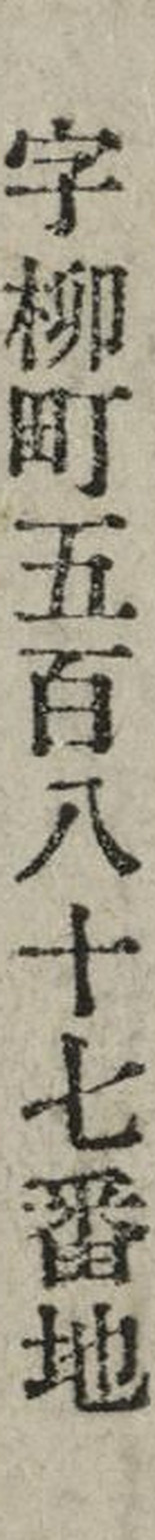字柳町五百八十七番地
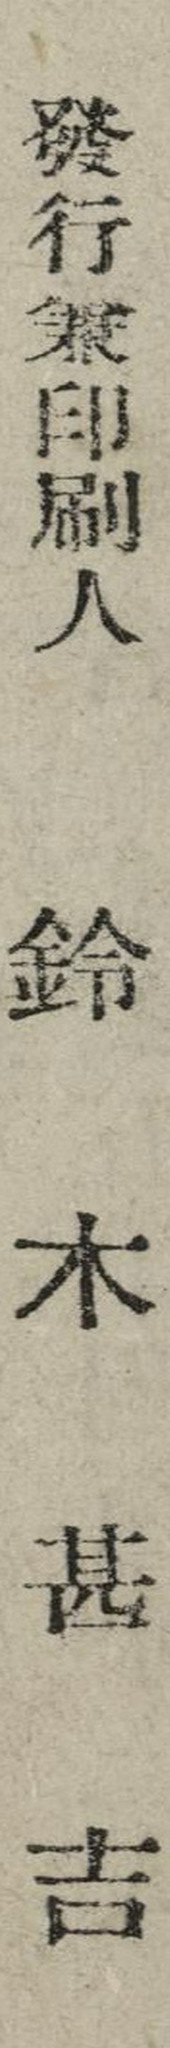発行兼印刷人鈴木甚吉
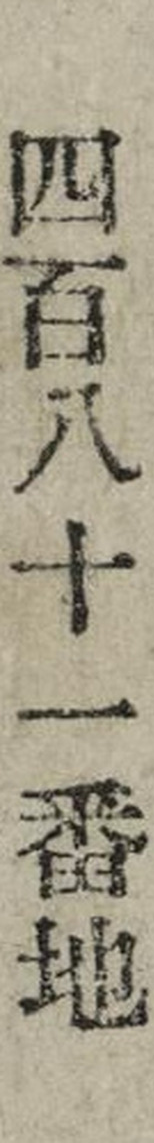四百八十一番地
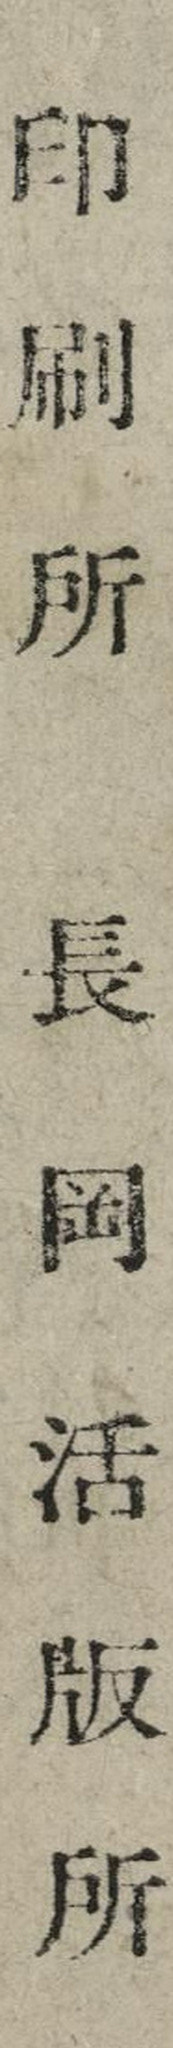印刷所長岡活版所
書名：三陸海嘯細見
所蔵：東京大学地震研究所図書室 Earthquake Research Institute Library, The University of Tokyo, JAPAN
